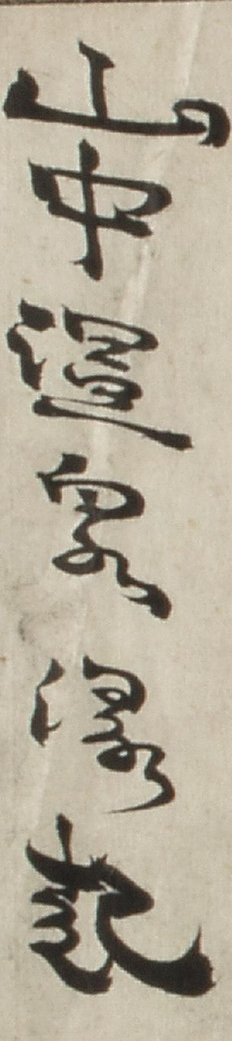山中温泉縁起

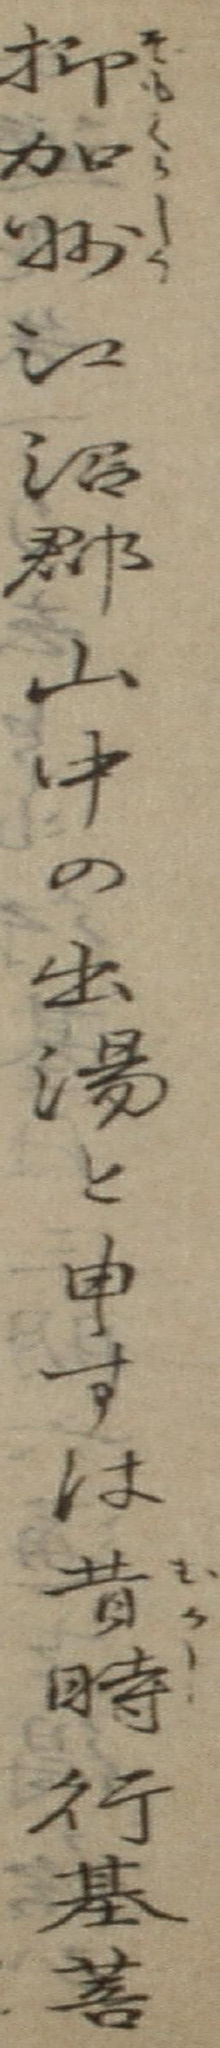抑加州江沼郡山中の出湯と申すは昔時行基菩
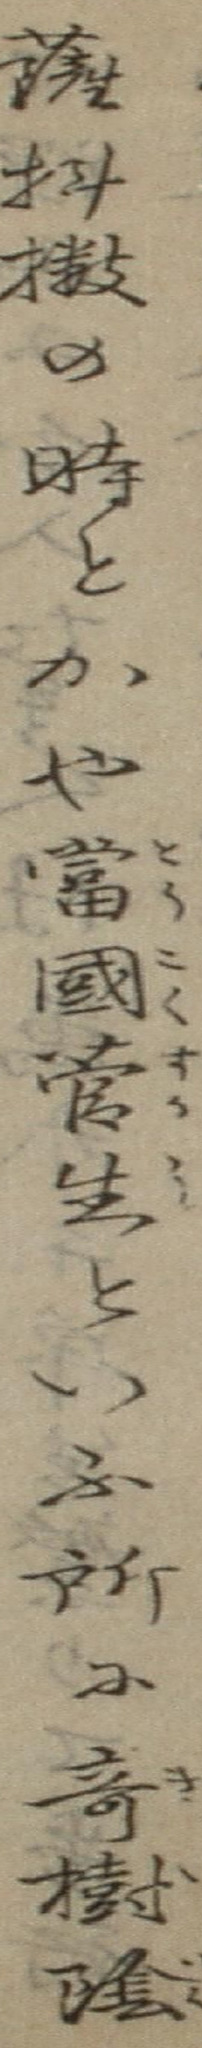薩抖擻の時とかや當國菅生といふ所に奇樹陰
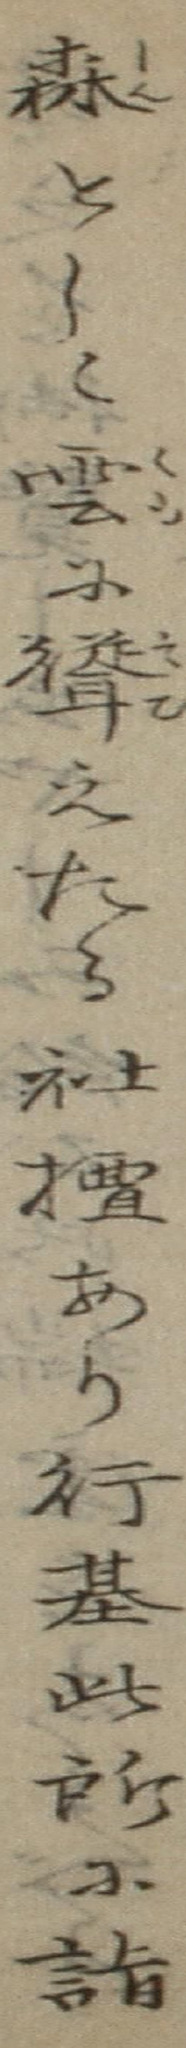森とした雲に聳えたる社擅あり行基此所に詣
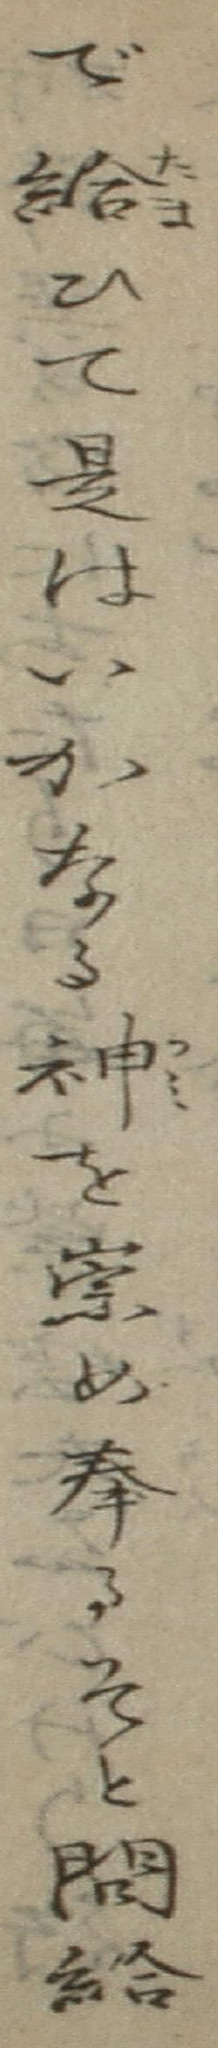で給ひて是はいかなる神を崇め奉るそと問給
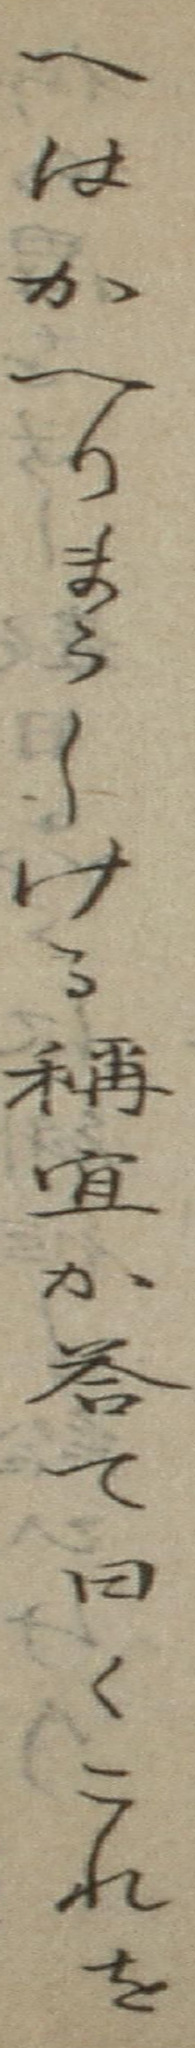へはかへりまかりける禰宜か答て曰くこれを
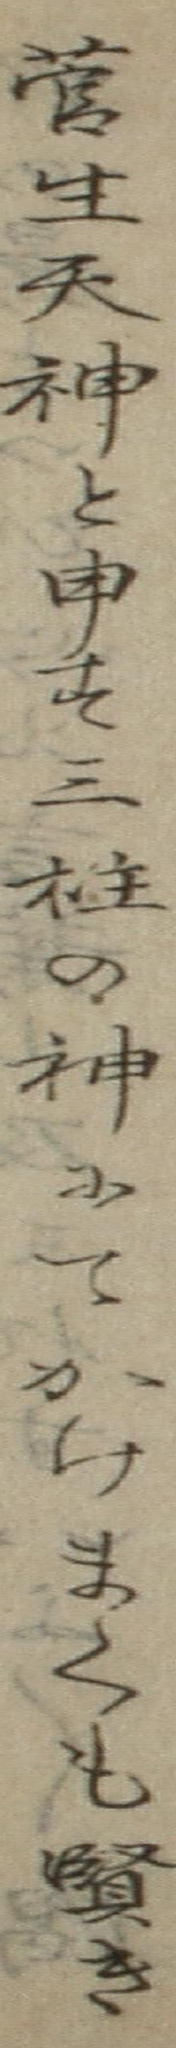菅生天神と申す三柱の神にてかけまくも賢き
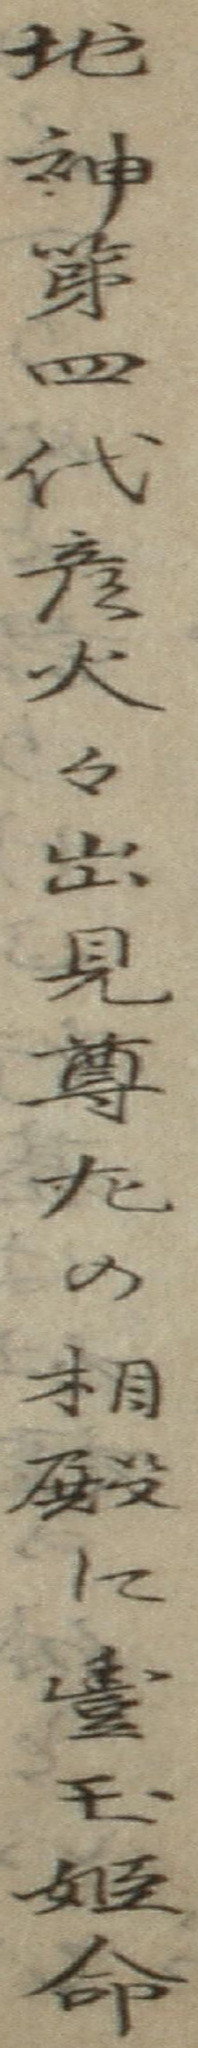地神第四代彦火々出見尊左の相殿に豊玉姫命
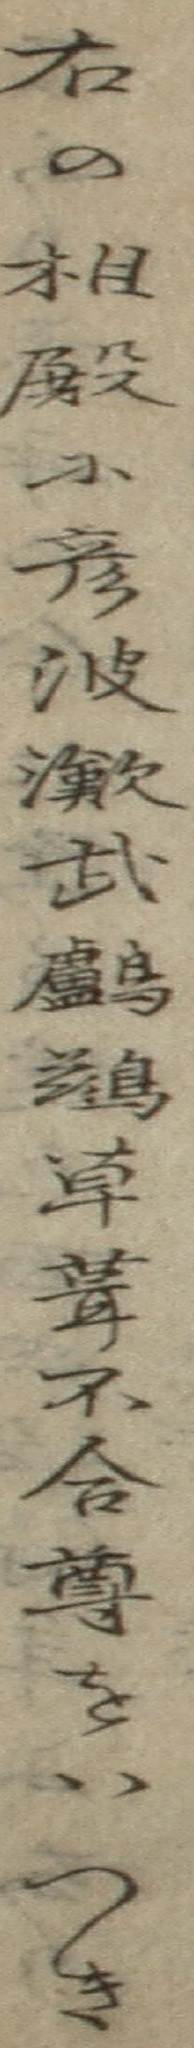右の相殿に彦波瀲武鸕鷀草葺不合尊をいつき
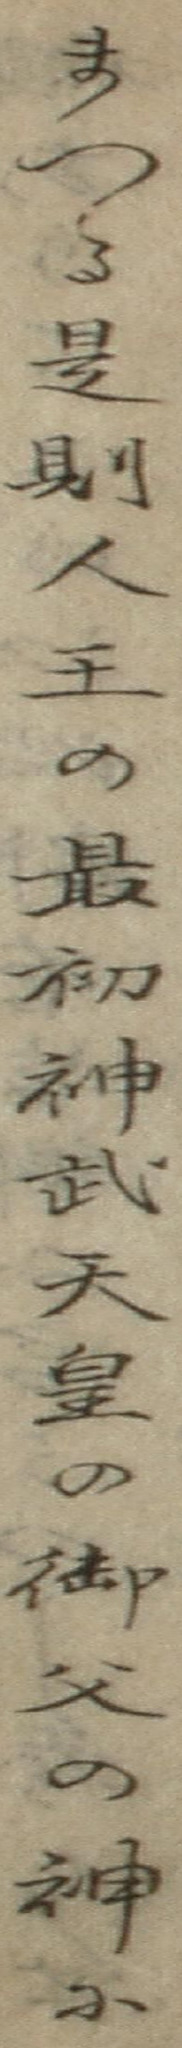まつる是則人王の最初神武天皇の御父の神に
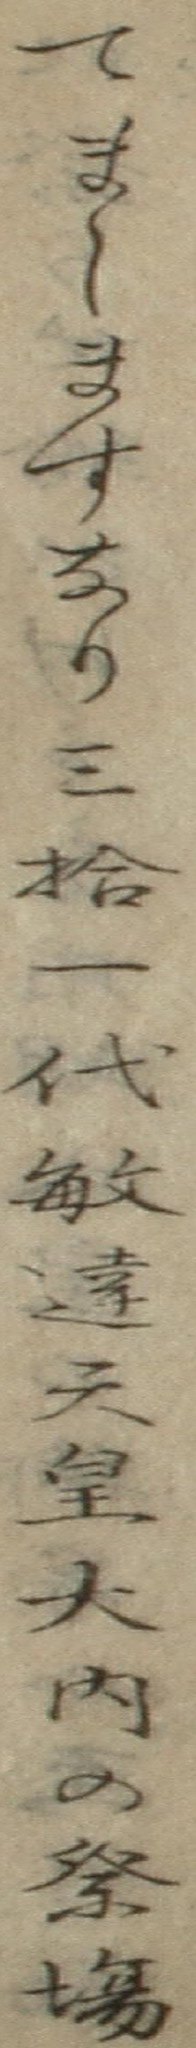てましますなり三拾一代敏達天皇大内の祭場

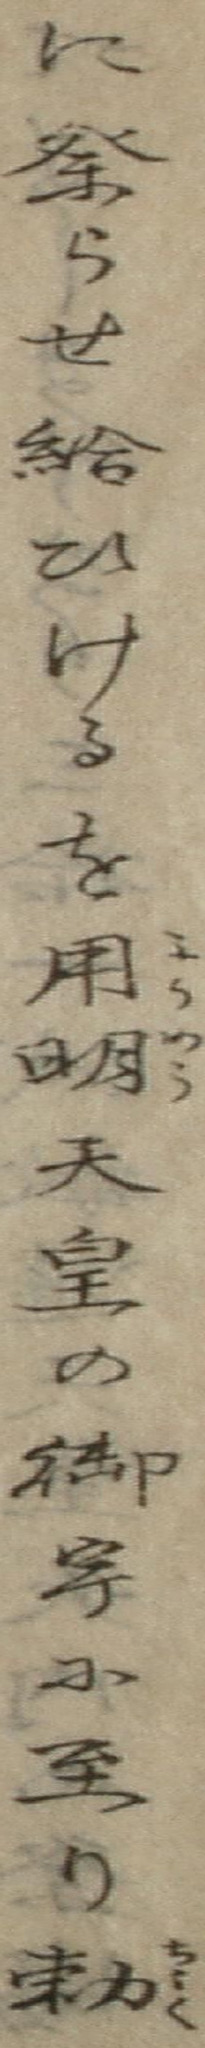に登らせ給ひけるを用明天皇の御年に至り勅
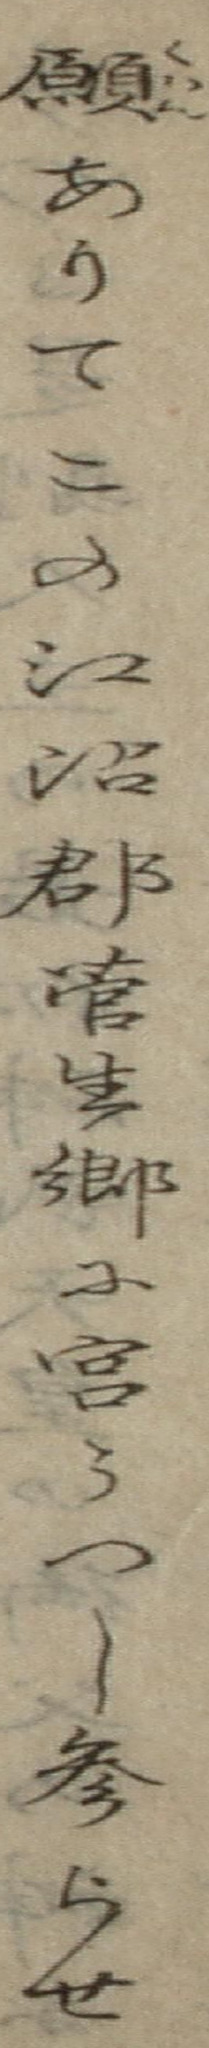願ありてこの江沼郡管生郷に宮うつし参らせ
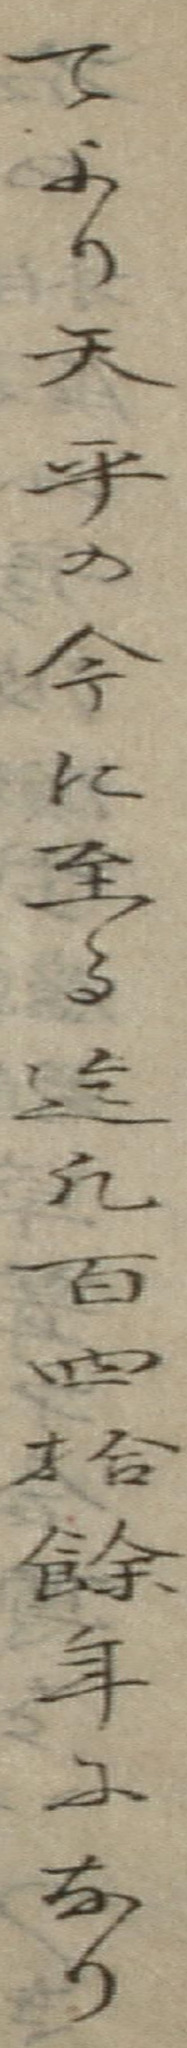てより天平の今に至る迄凡百四拾余年になり
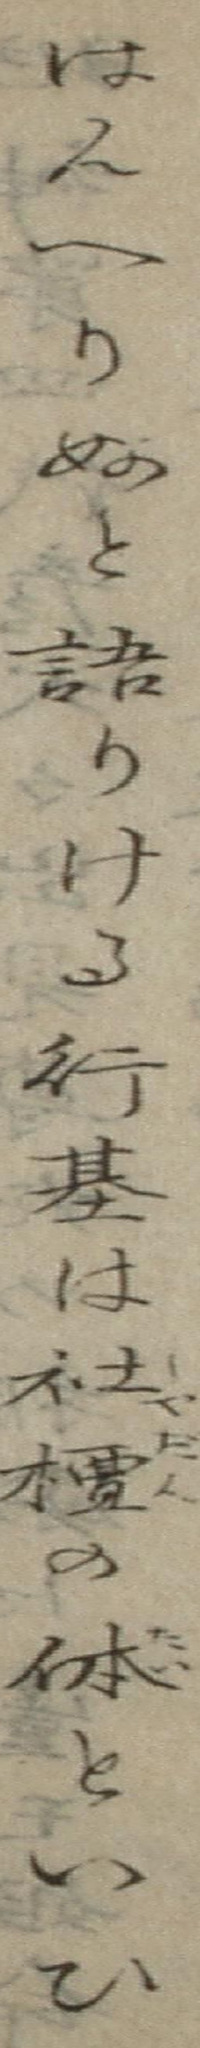はんへりぬと語りける行基は社檀の体といひ
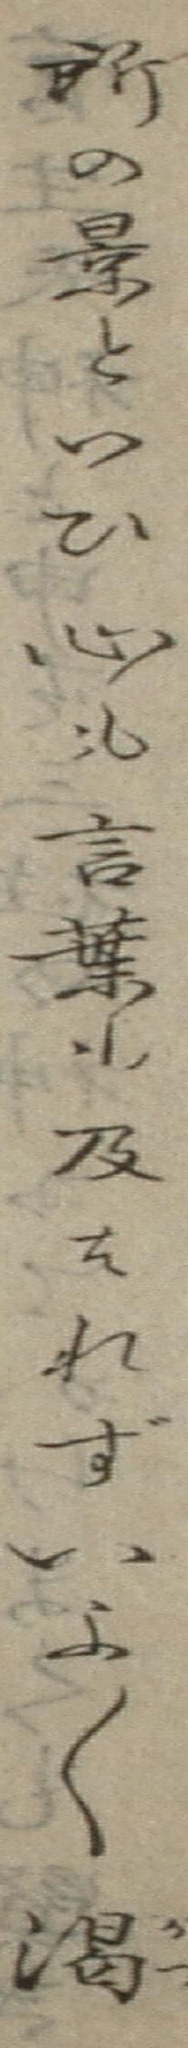所の景といひ心も言葉も及はれずいよ〳〵渇
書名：山中温泉縁記并ニ入浴之心得
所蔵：東京大学地震研究所図書室 Earthquake Research Institute Library, The University of Tokyo, JAPAN
